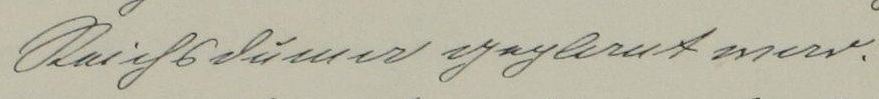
Reichsduma geplant war.
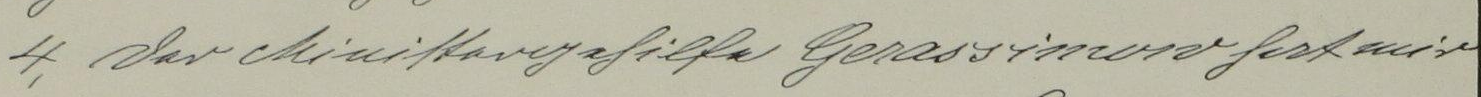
4. Der Ministergehilfe Gerassimow hat mir
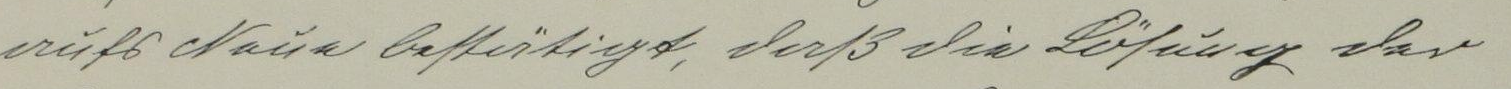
aufs Neue bestätigt, daß die Lösung der
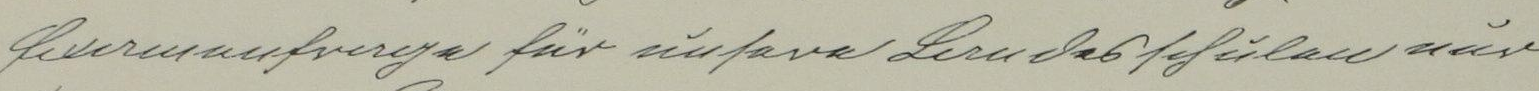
Examenfrage für unsere Landesschulen nur
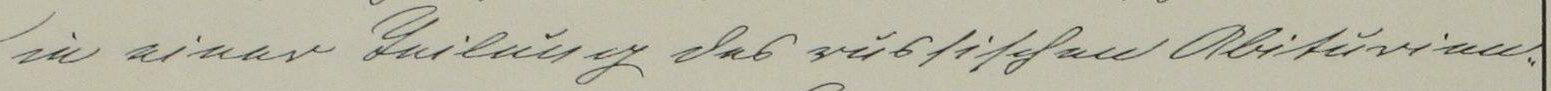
in einer Teilung des russischen Abiturien-
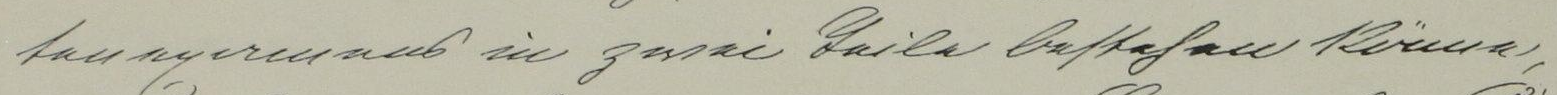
tenexamens in zwei Teile bestehen könne,
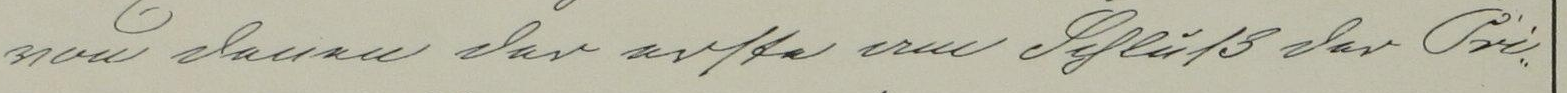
von denen der erste am Schluß der Pri-
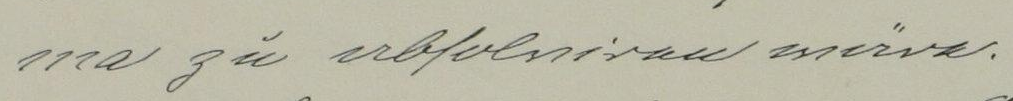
ma zu absolviren wäre.
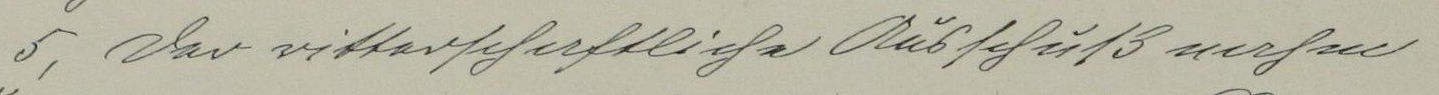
5. Der ritterschaftliche Ausschuß nahm
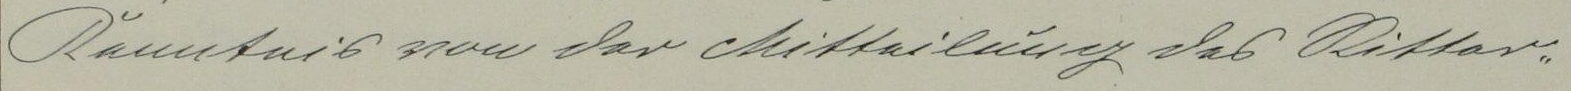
Kenntnis von der Mitteilung des Ritter-
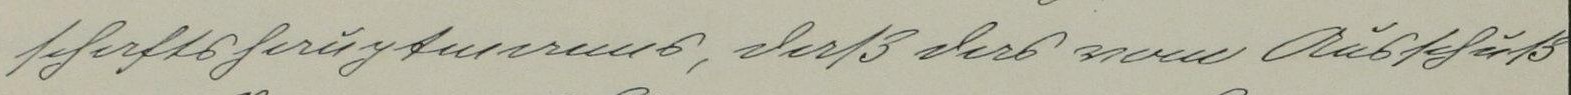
schaftshauptmanns, daß das vom Ausschuß
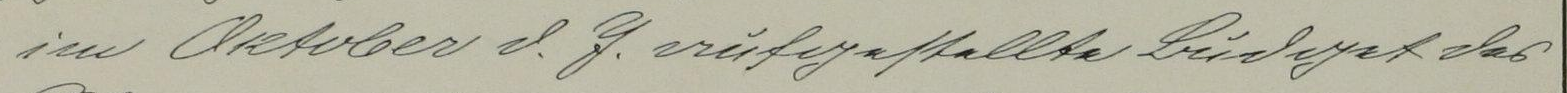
im Oktober d.J. aufgestellte Budget des
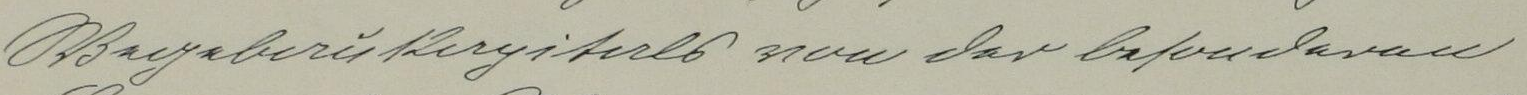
Wegebaukapitals von der Besonderen
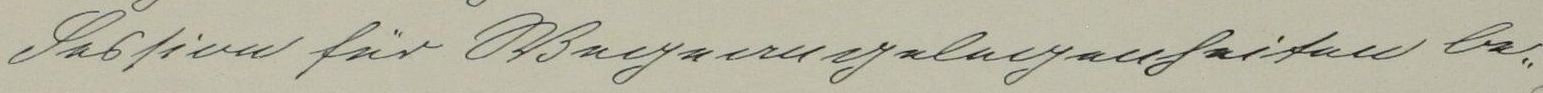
Session für Wegeangelegenheiten be-
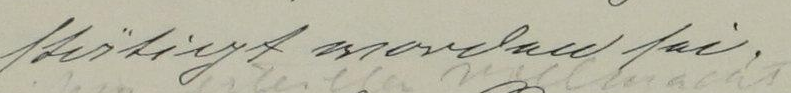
stätigt worden sei.
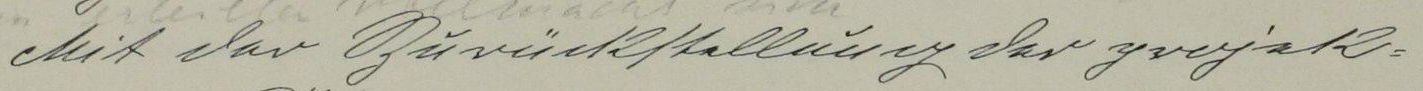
Mit der Zurückstellung der projek-
